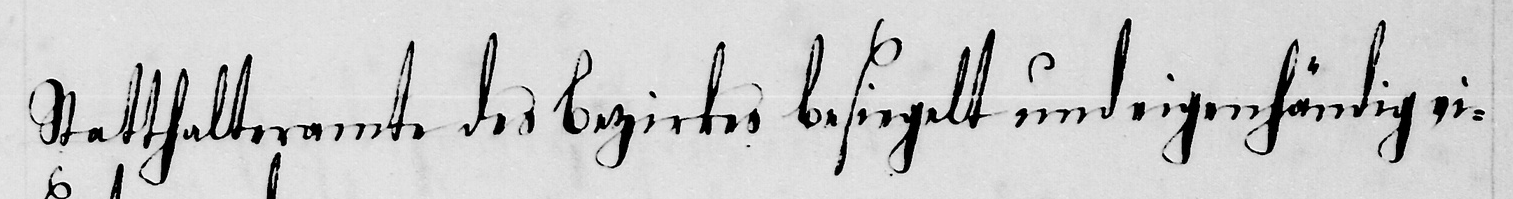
Statthalteramte des Bezirkes besiegelt und eigenhändig vi¬
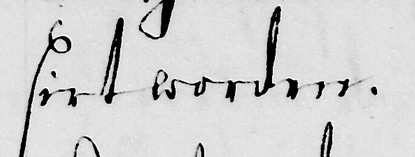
sirt worden.
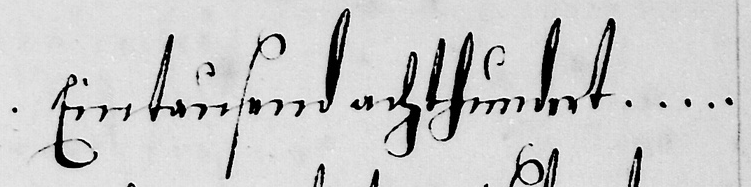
Eintausend achthundert
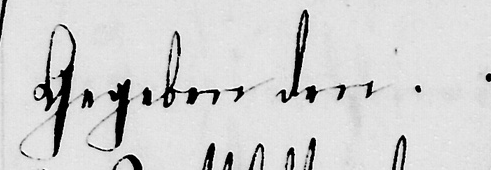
Gegeben den
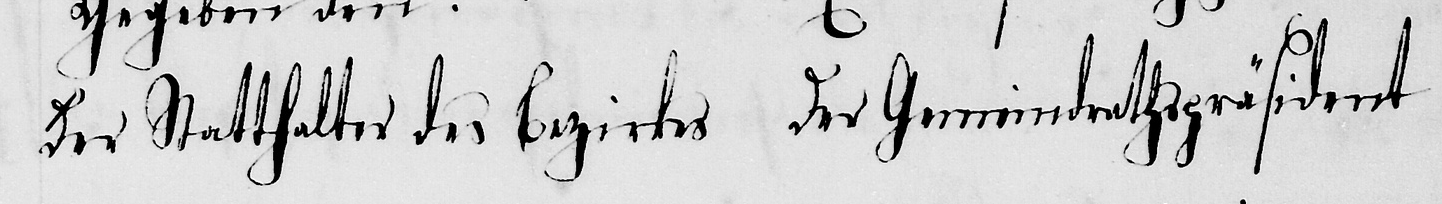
Der Statthalter des Bezirkes Der Gemeindrathspräsident
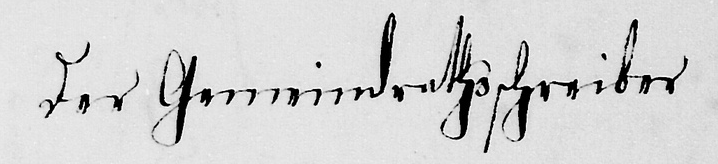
Der Gemeindrathsschreiber
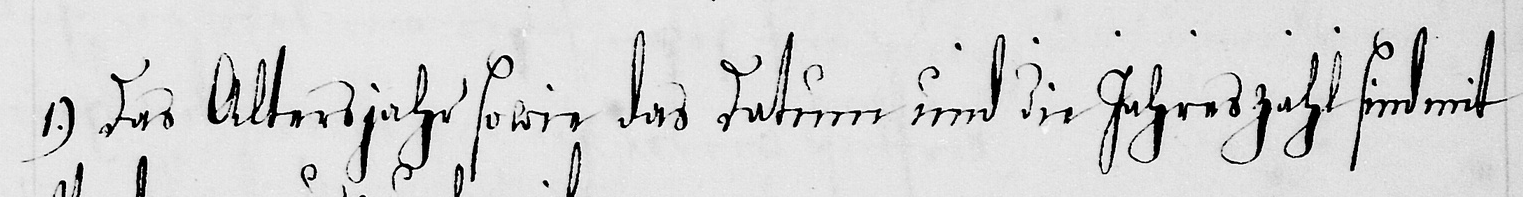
1.) Das Altersjahr sowie das Datum und die Jahreszahl sind mit
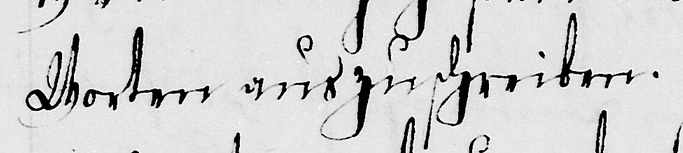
Worten auszuschreiben.
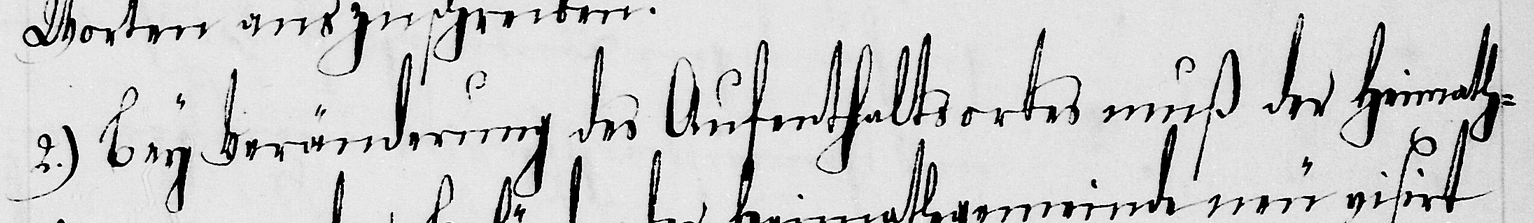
2.) Bey Veränderung des Aufenthaltsortes muß der Heimath¬
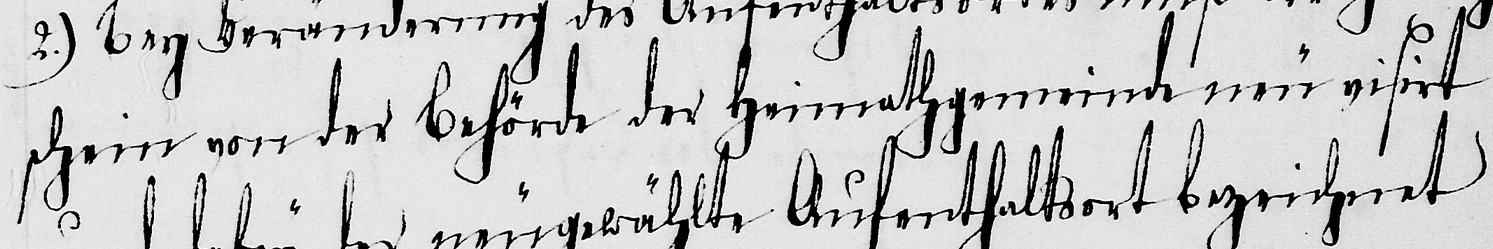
schein von der Behörde der Heimathgemeinde neu visirt
